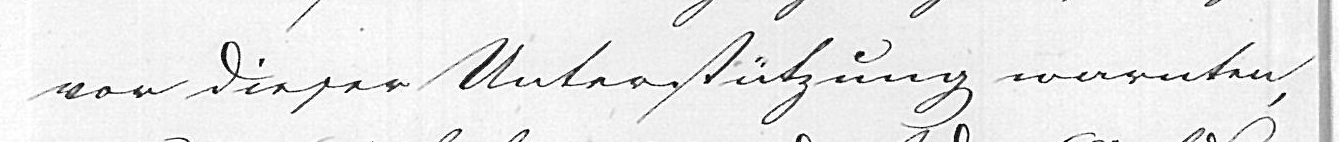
vor dieser Unterstützung warnten,
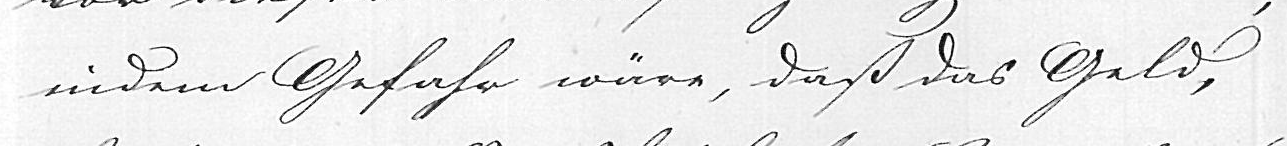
indem Gefahr wäre, daß das Geld,
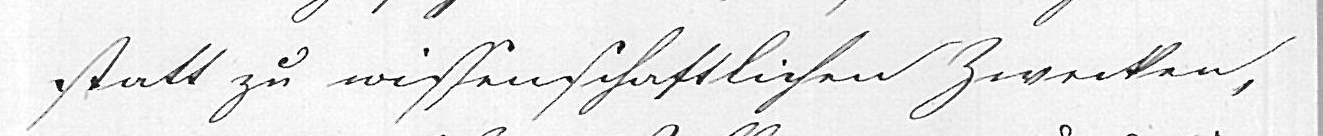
statt zu wissenschaftlichen Zwecken,
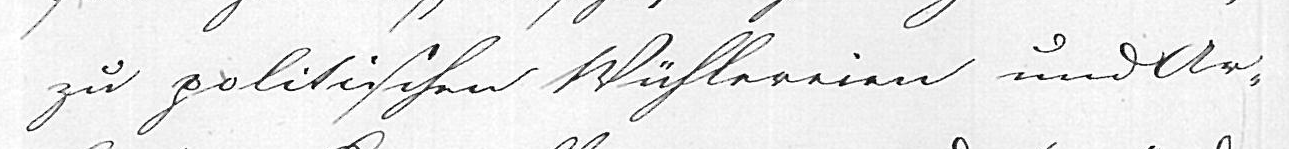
zu politischen Wühlereien und Ar-
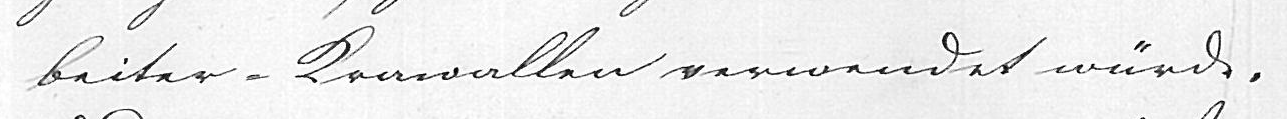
beiter-Krawallen verwendet würde.
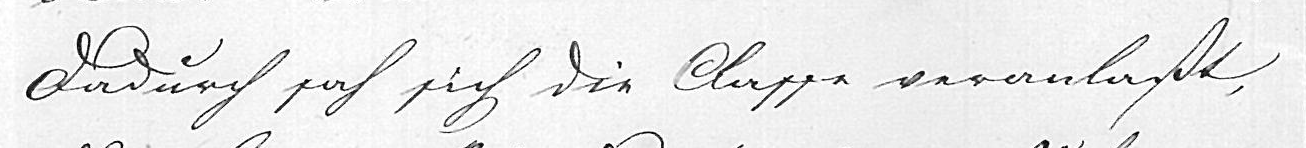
Dadurch sah sich die Classe veranlaßt,
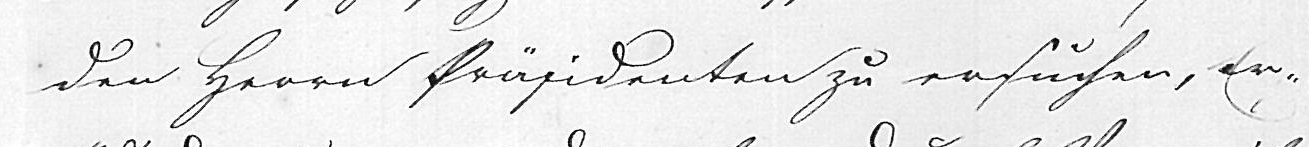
den Herrn Präsidenten zu ersuchen, Er-
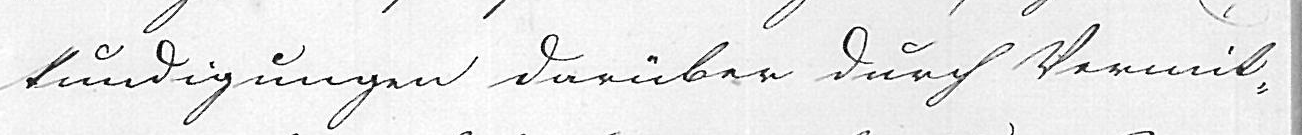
kundigungen darüber durch Vermit-
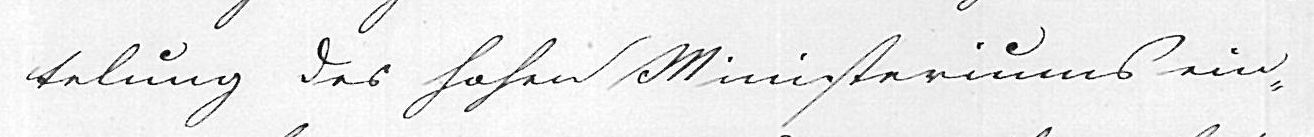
telung des hohen Ministeriums ein-
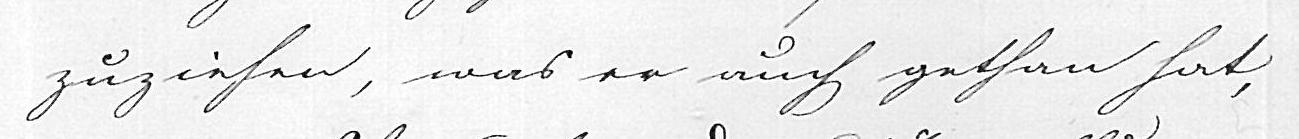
zuziehen, was er auch gethan hat,
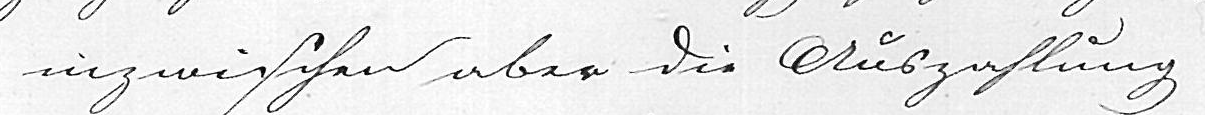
inzwischen aber die Auszahlung
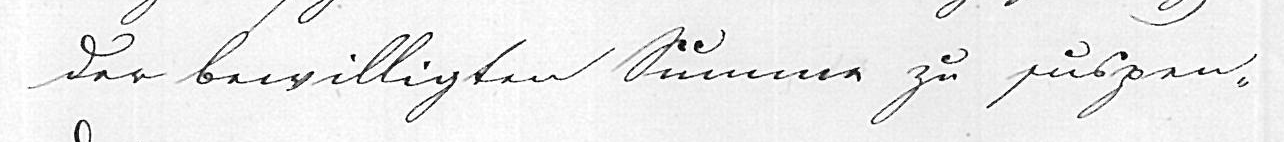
der bewilligen Summe zu suspen-
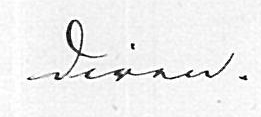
diren.
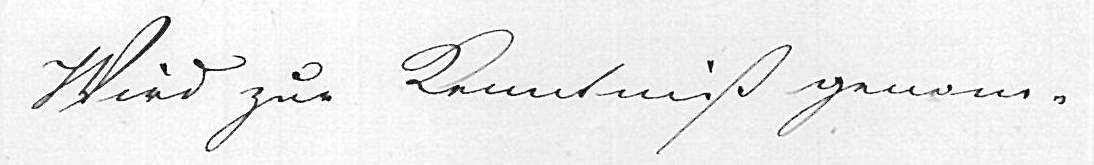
Wird zur Kenntniß genom-
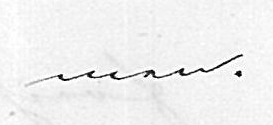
men.
